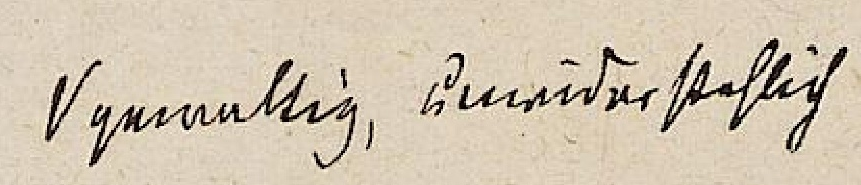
V gewaltig, unwiderstehlich
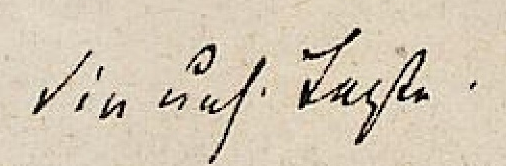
V in uns. Texte.
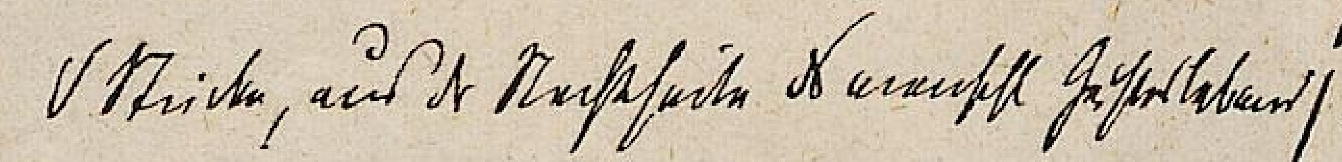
V Stücke, aus dr Nechtseite ds ds menschl Geisteslebens
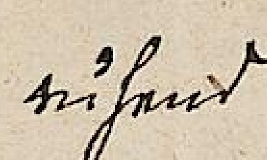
ruhend
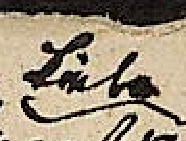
Liebe
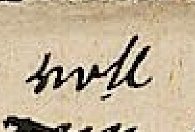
voll
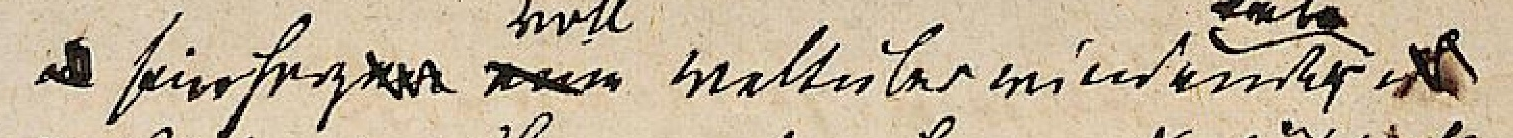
sein Herzen rein weltüberwindender üb
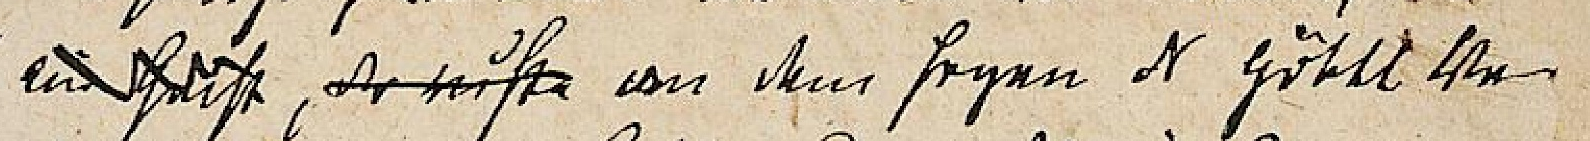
ein Geist, der ruhte an dem Segen ds Göttl. Va¬
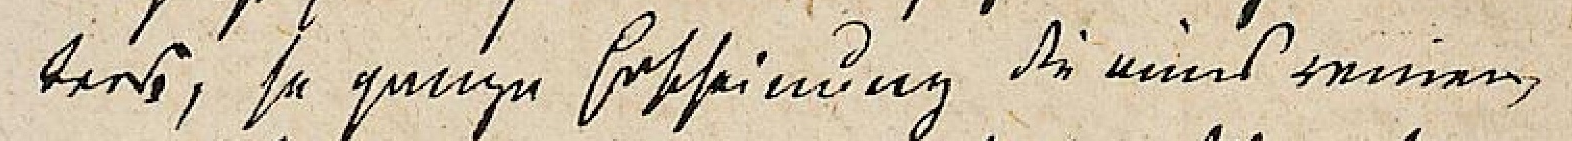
ters, sn ganze Erscheinung die eines reinen,
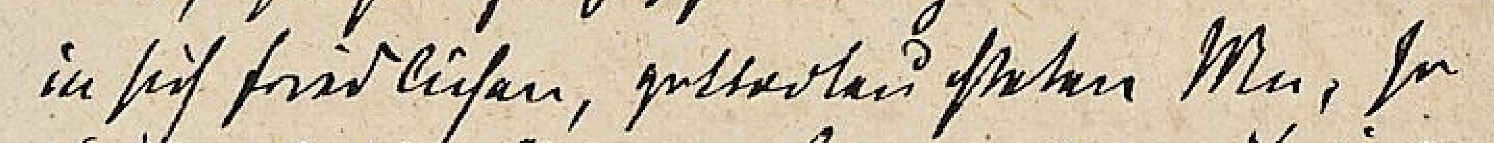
in sich friedlichen, gotterleuchteten Mn, so
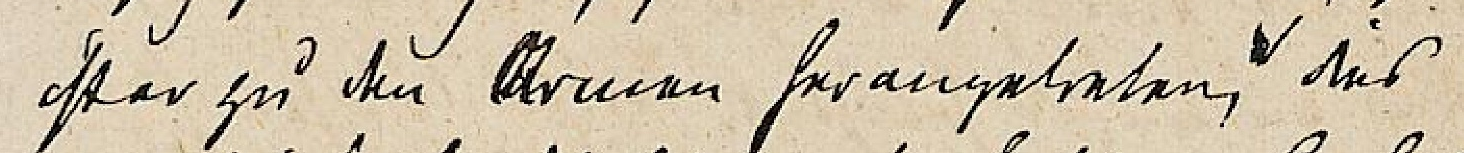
ist er zu den Armen herangetreten, dies
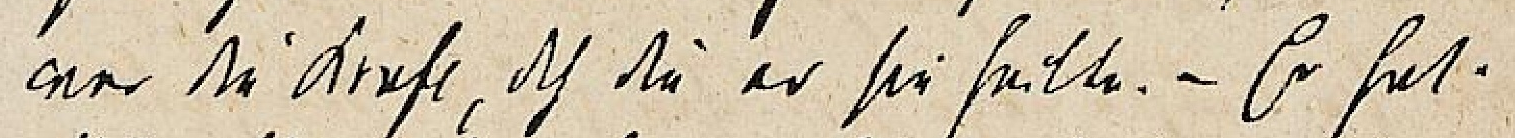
war die Kraft, dch die er sie heilte. _ Er hat
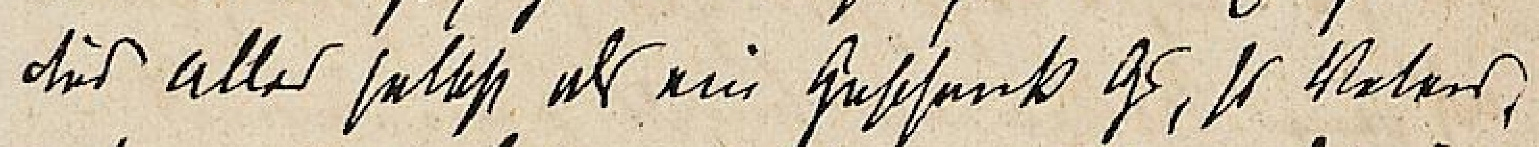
dies alles selbst als ein Geschenk Gs, ss Vaters,
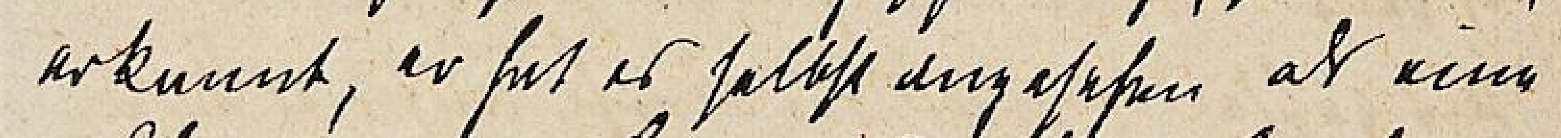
erkannt, er hat es selbst angesehen als eine
